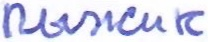пыжик
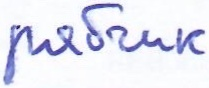рябчик
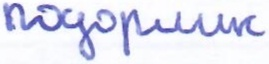подорлик
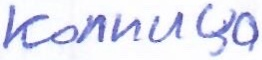колпица
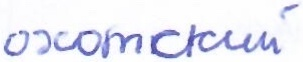охотский
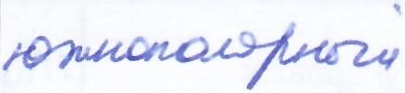южнополярный
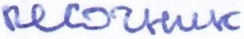песочник
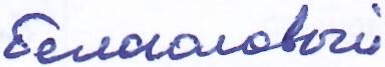белаоловый
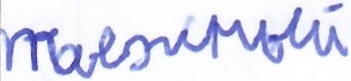таежный
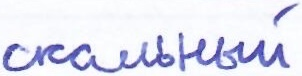скальный
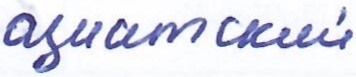азиатский
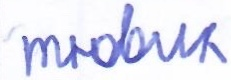тювик
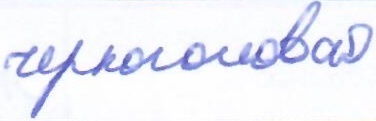черноголовая
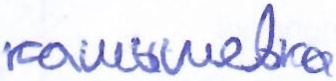камышевка
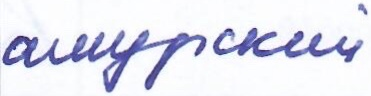амурский
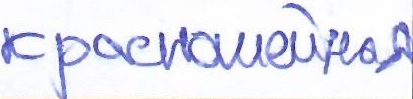красношейная
